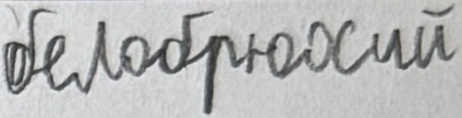белобрюхий
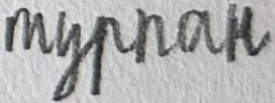турпан
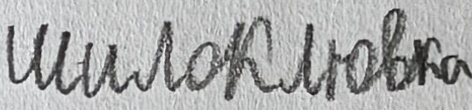шилоклювка
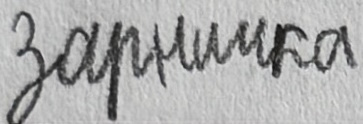зарничка
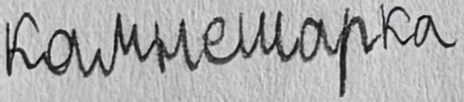камнешарка
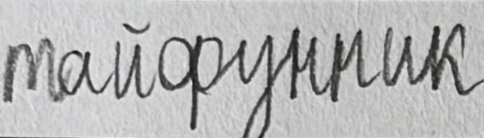тайфунник
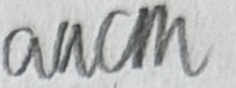аист
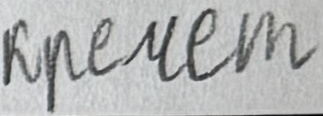кречет
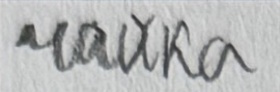чайка
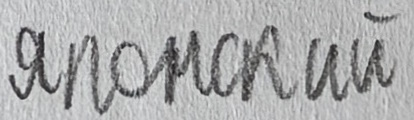японский
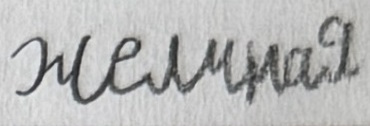желчная
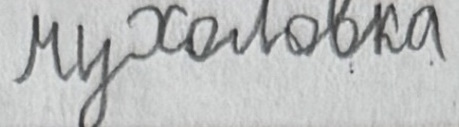мухоловка
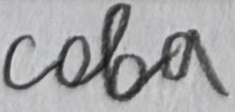сова
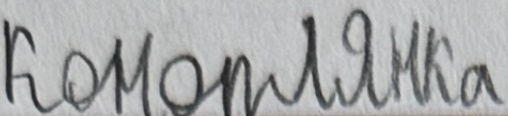коноплянка
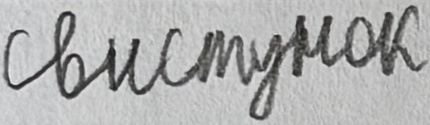свистунок
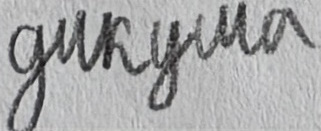дикуша
